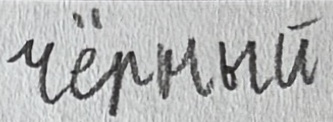чёрный
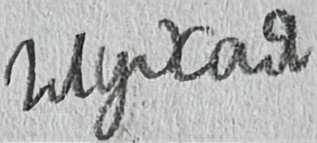глухая
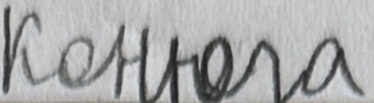конюга
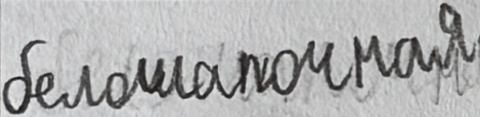белошапочная
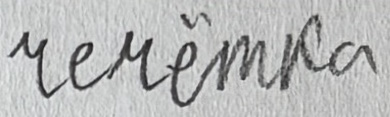чечётка
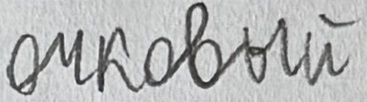очковый
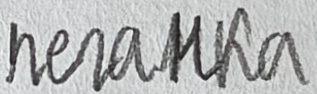пеганка
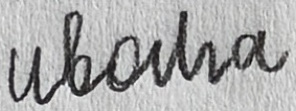иволга
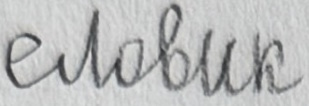еловик
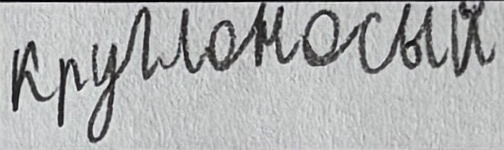круглоносый
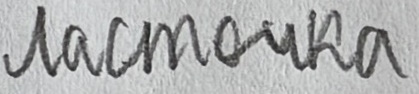ласточка
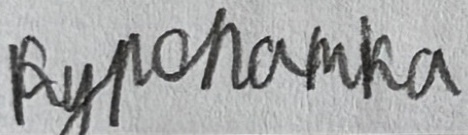куропатка
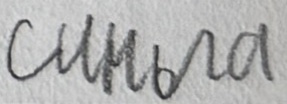синьга
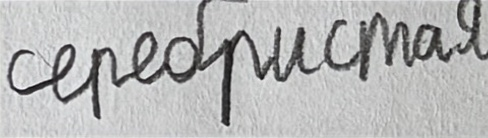серебристая
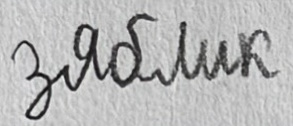зяблик
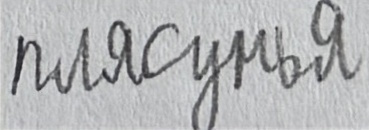плясунья
